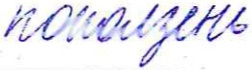поползень
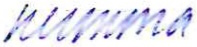питта
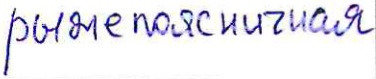рыжепоясничная
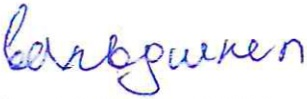вальдшнеп
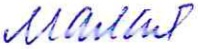малая
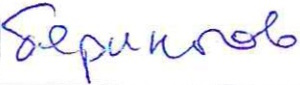берингов
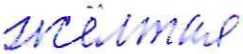жёлтая
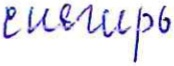снегирь
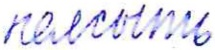неясыть
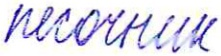песочник
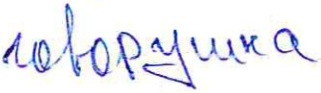говорушка
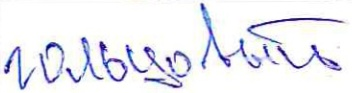гольцовый
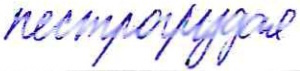пестрогрудая
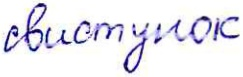свистунок
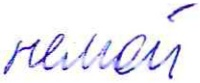немой
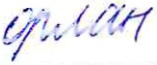орлан
